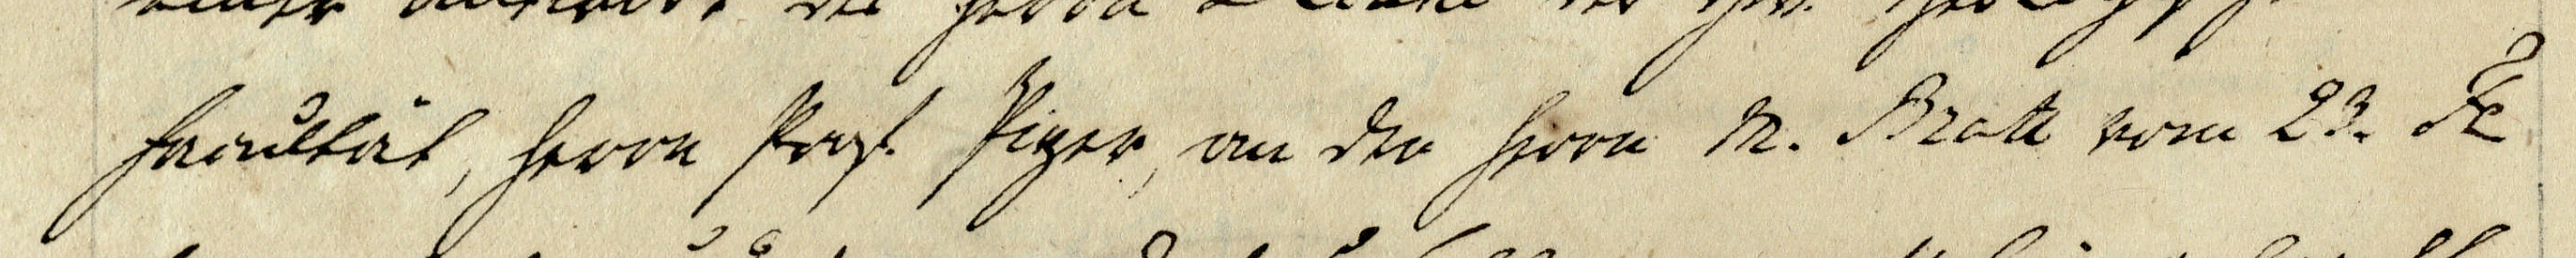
Facultät, Herrn Prof. Piper an den Herrn M. Bratt vom 23. Fe¬
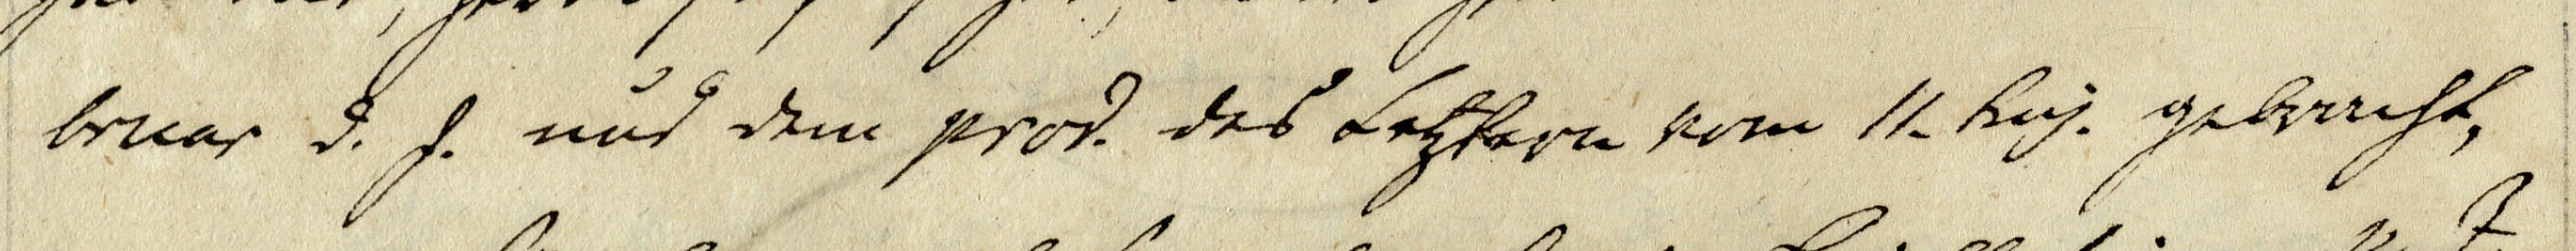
bruar d. J. und dem prod. des Letztern vom 11. huj. gebracht,
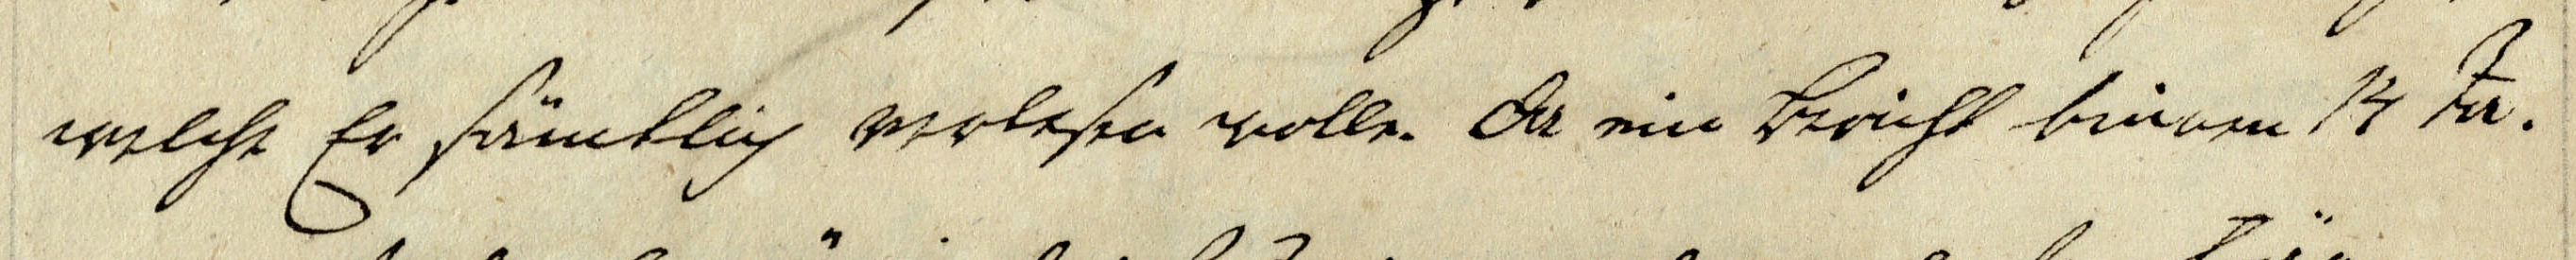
welche Er sämtlich verlesen wolle. Da ein Bericht binnen 14 Ta¬
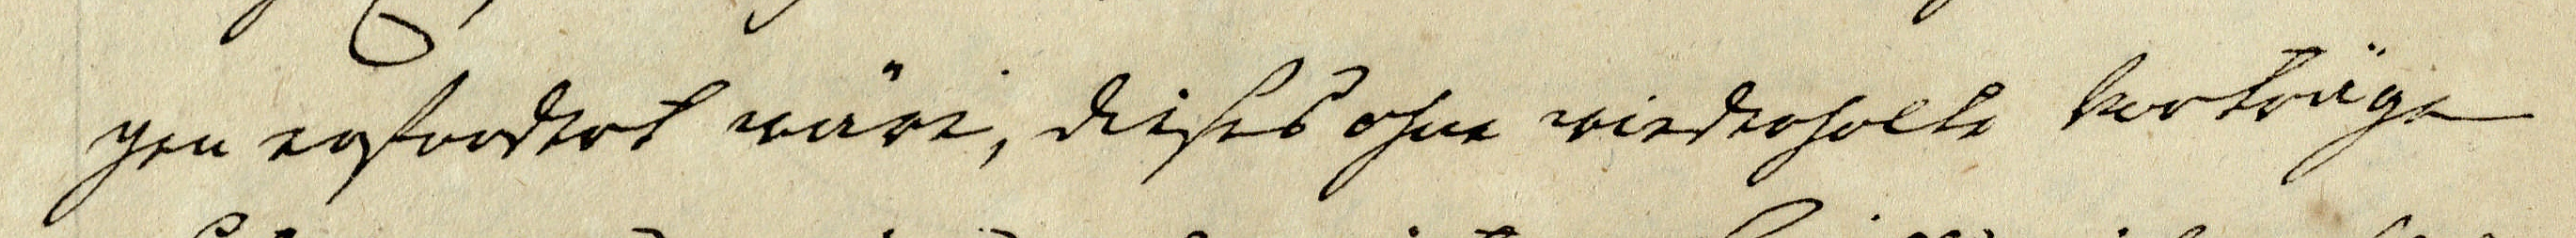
gen erfordert wäre, dieses ohne wiederholte Vorträge
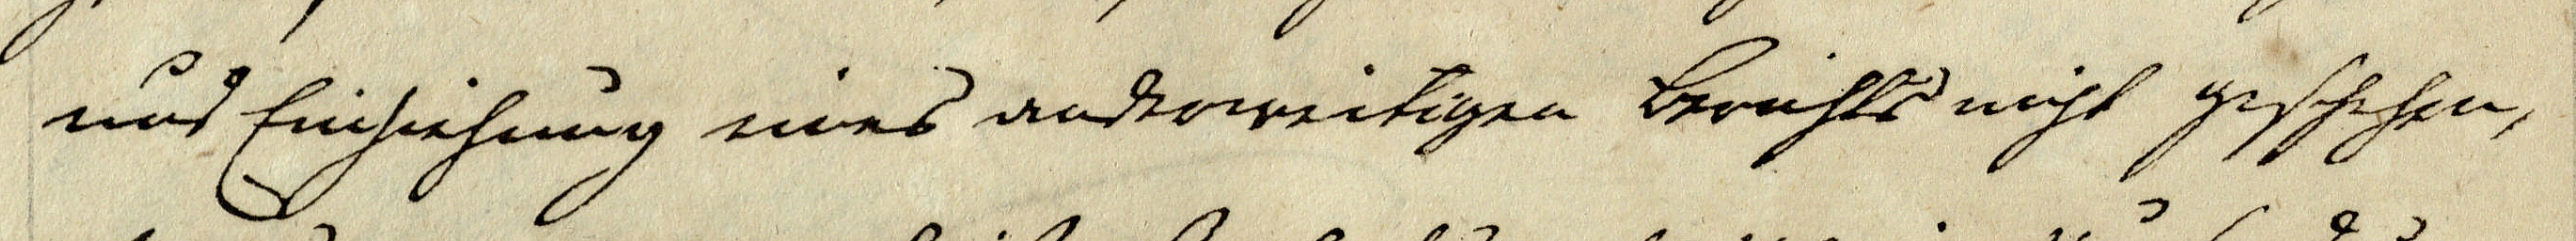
und Einziehung eines anderweitigen Berichts nicht geschehen,
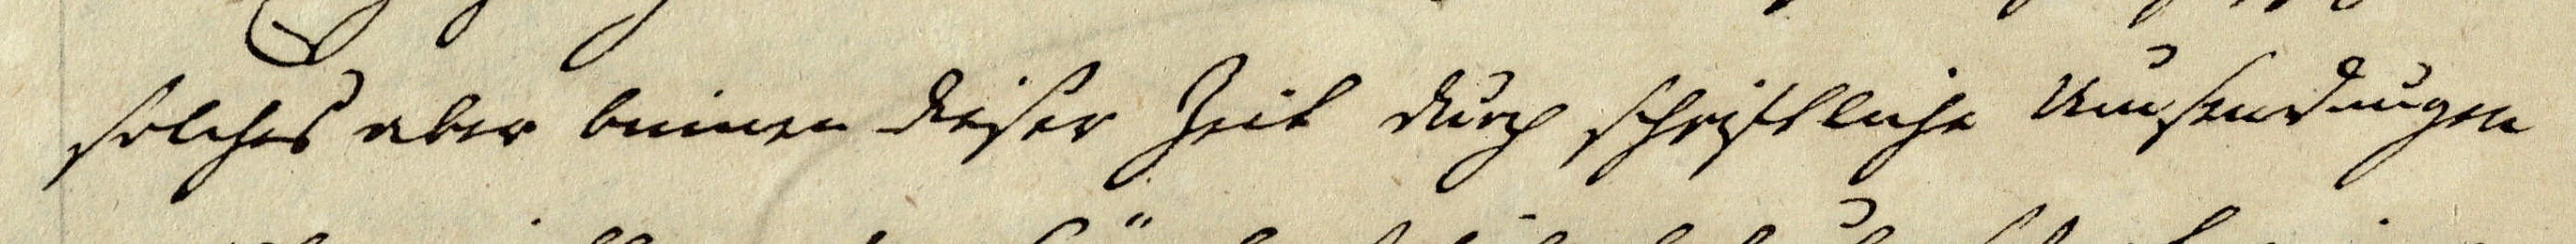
solches aber binnen dieser Zeit durch schriftliche Umsendugen
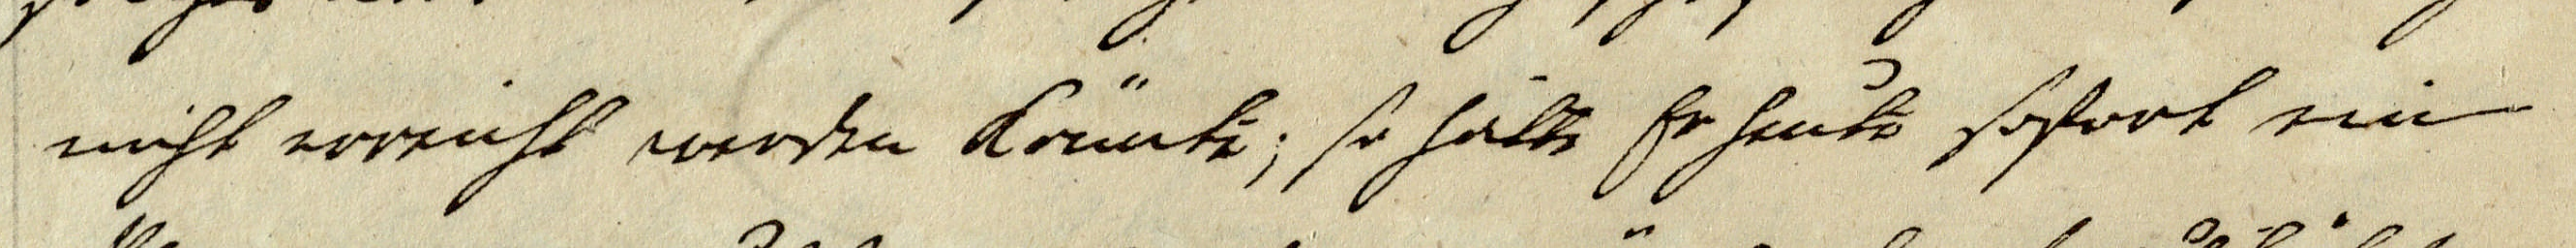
nicht erreicht werden könnte; so hätte Er heute sofort ein
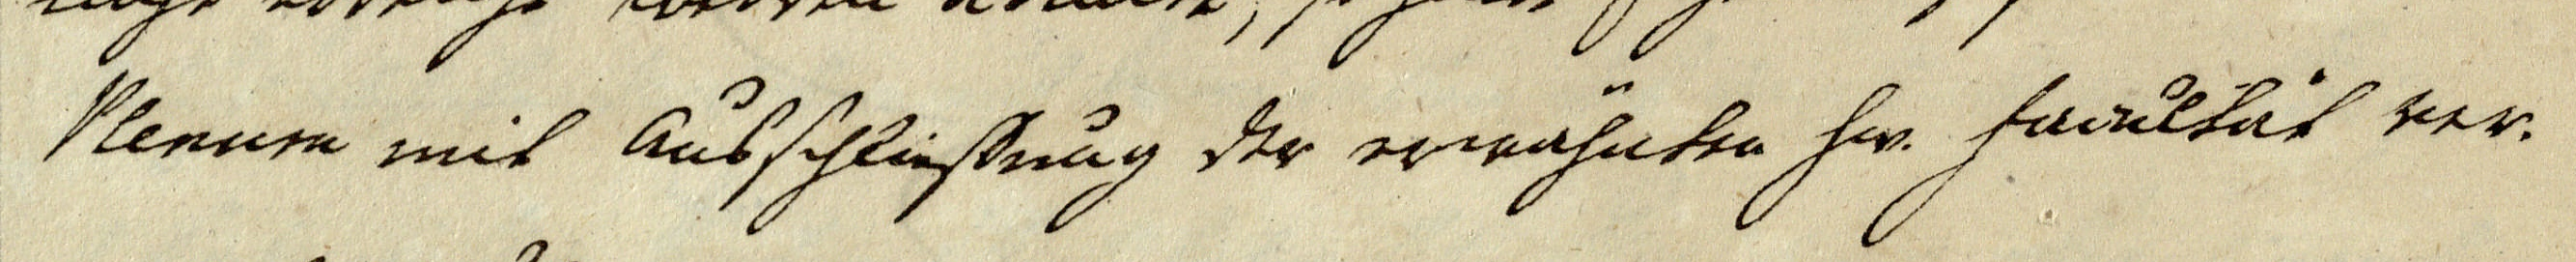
Plenum mit Ausschließung der erwähnten hw. Facultät ver¬
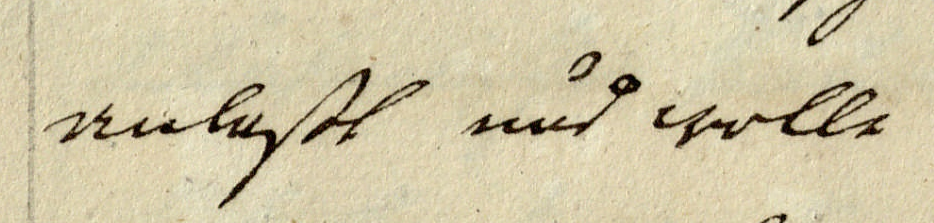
anlaßt und wolle
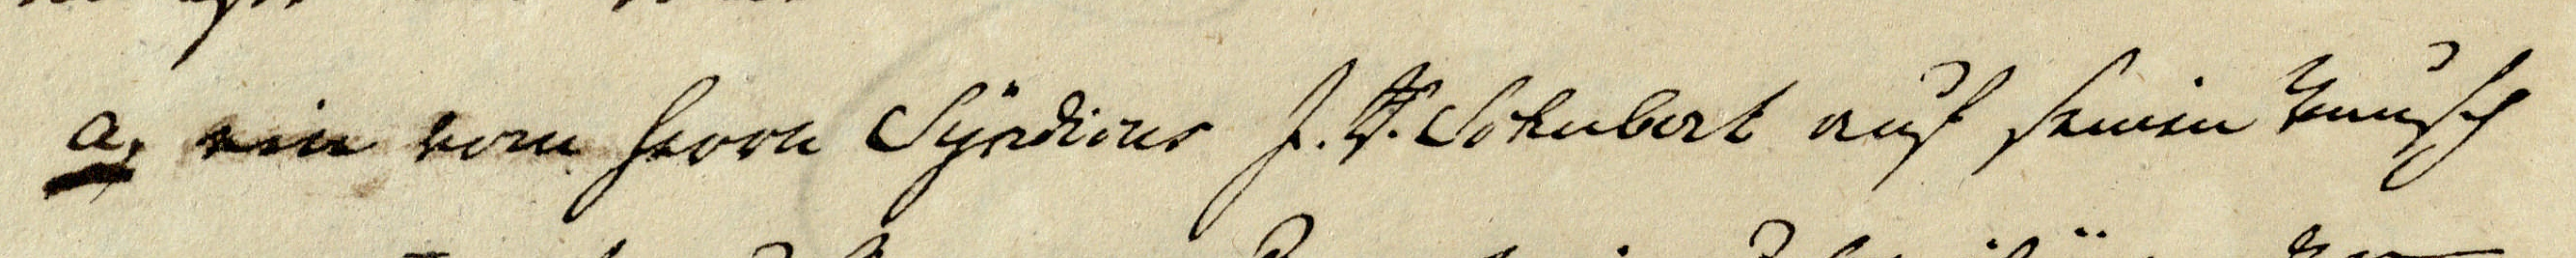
a. ein vom Herrn Sÿndicus J. R. Schubert auf seinen Wunsch
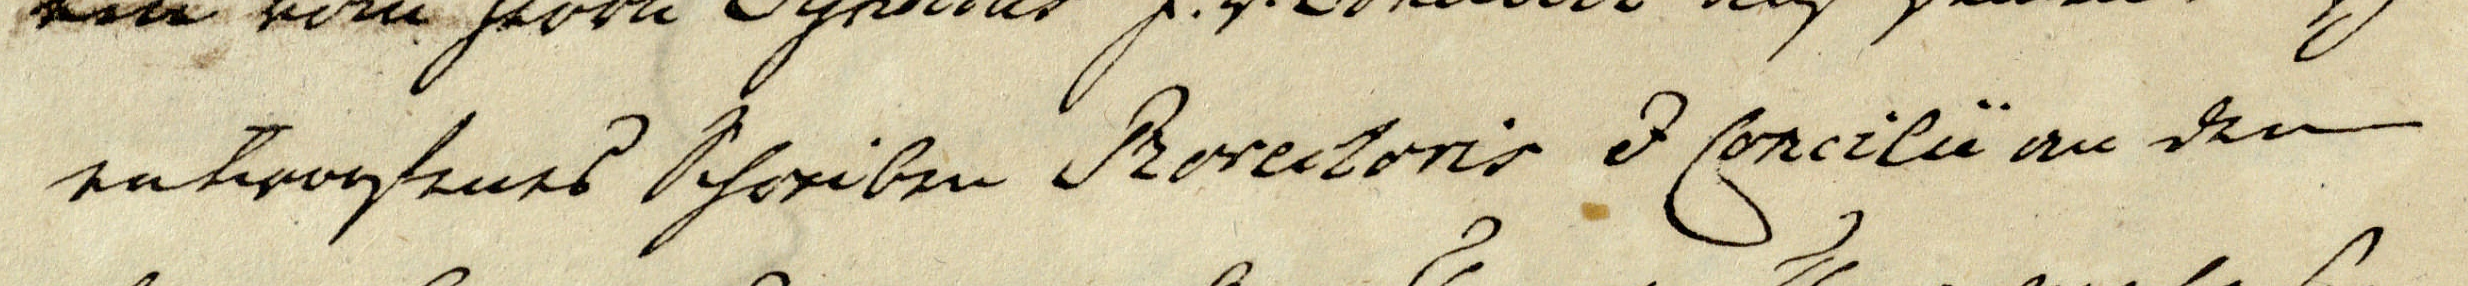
entworfenes Schreiben Prorectoris et Concilii an den
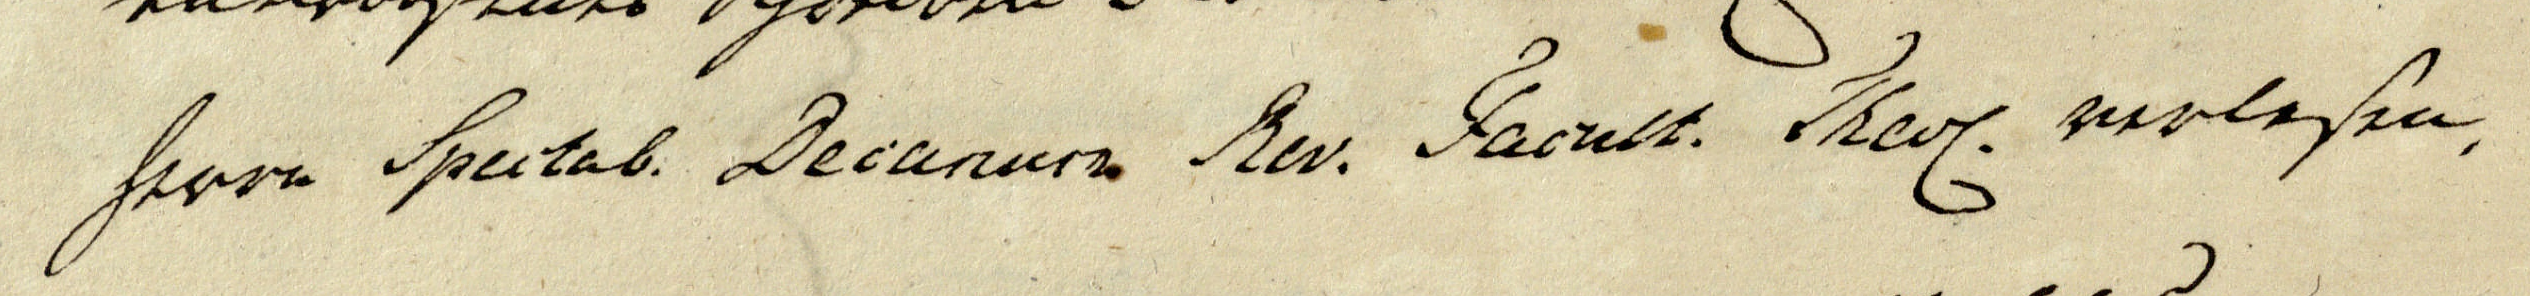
Herrn Spectab. Decanum Rer. Facult. Theol. verlesen,
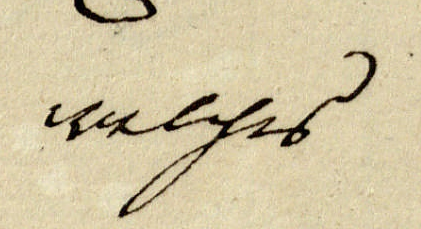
welches
